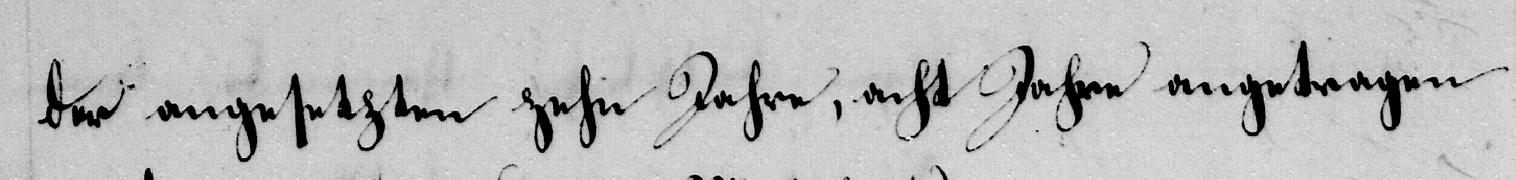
der angesetzten zehn Jahre, acht Jahre angetragen
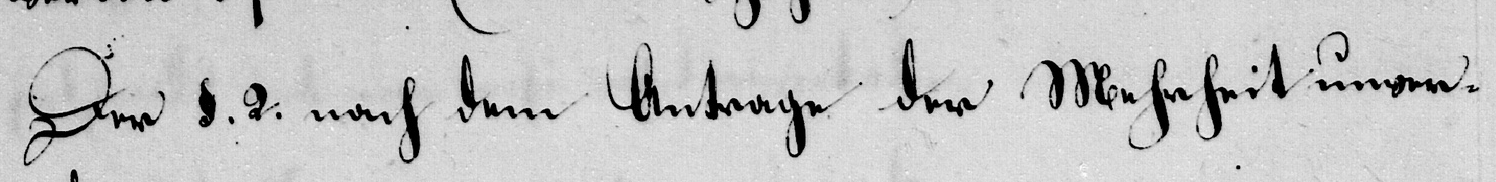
Der §. 2. nach dem Antrage der Mehrheit unver¬
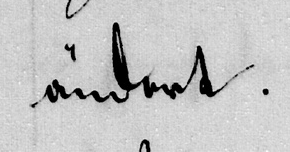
ändert.
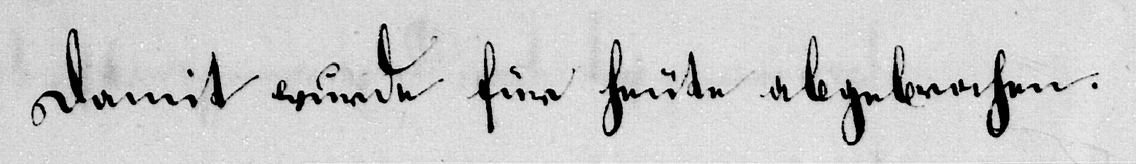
Damit wurde für heute abgebrochen.
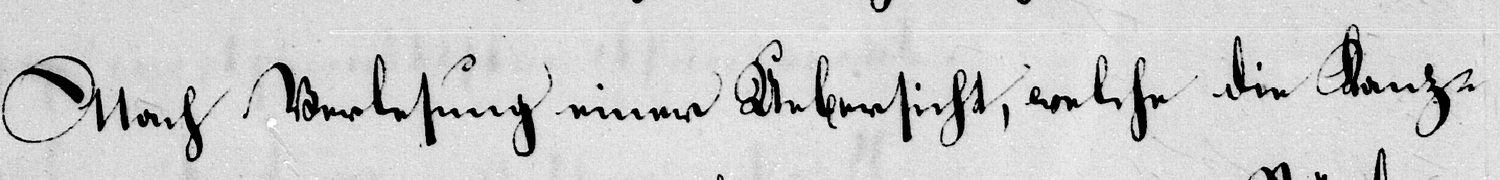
Nach Verlesung einer Uebersicht, welche die Kanz¬
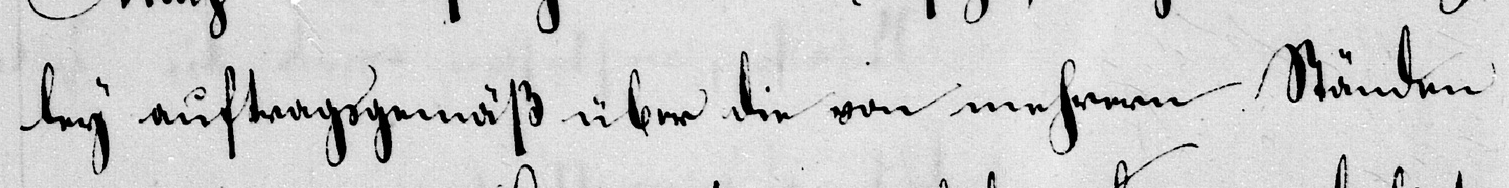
ley auftragsgemäß über die von mehrern Ständen
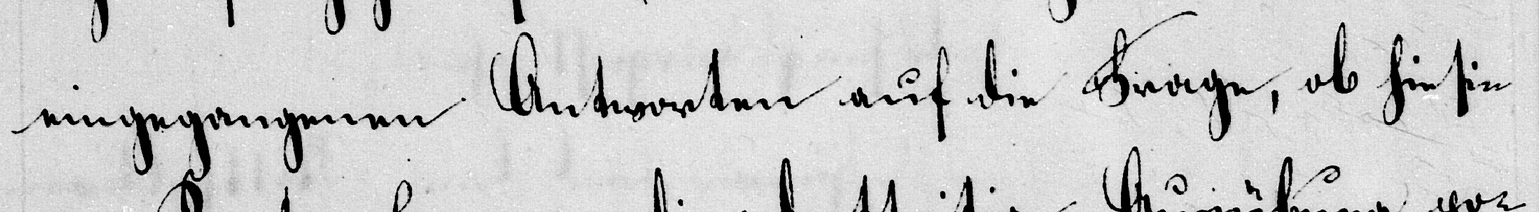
eingegangenen Antworten auf die Frage, ob hiesi¬
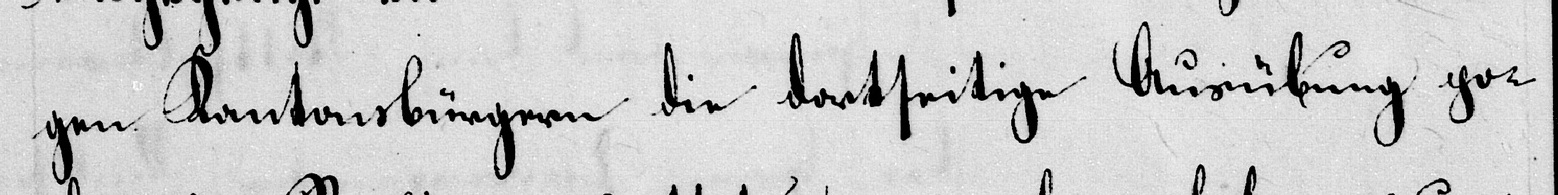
gen Kantonsbürgern die dortseitige Ausübung po¬
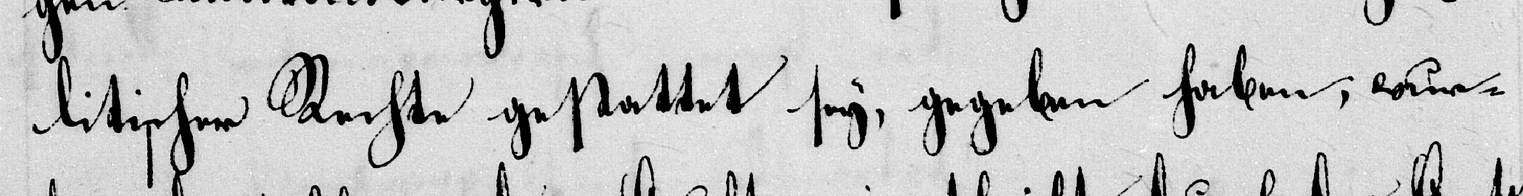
litischer Rechte gestattet sey, gegeben haben, wur¬
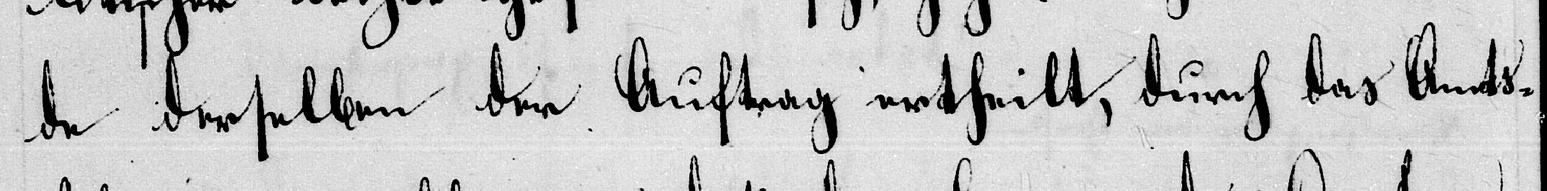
de derselben der Auftrag ertheilt, durch das Amts¬
